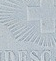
Bern
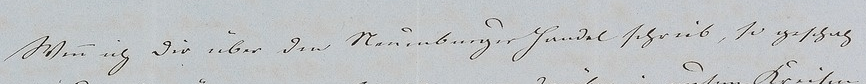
Wenn ich Dir über den Neuenburger Handel schrieb, so geschah
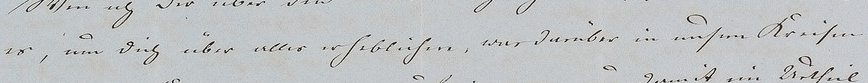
es, um dich über alles erheblichere, was darüber in unsern Kreisen
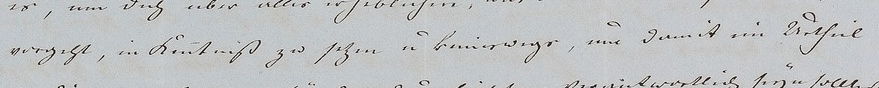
vorgeht, in Kenntniß zu setzen u keineswegs, um damit ein Urtheil
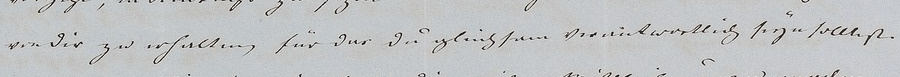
von dir zu erhalten, für das du gleichsam verantwortlich seyn solltest.
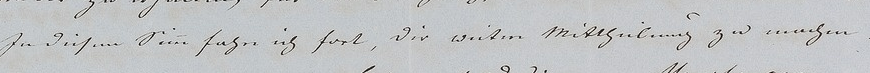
In diesem Sinne fahre ich fort, dir weitere Mittheilung zu machen.
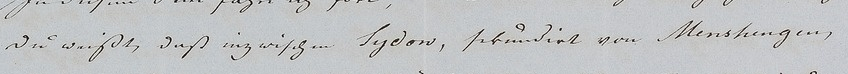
Du weißt, daß inzwischen Sydow, sekundirt von Menshengen,
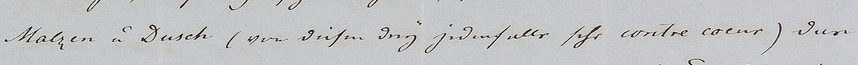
Malzen u Dusch (von diesen drey jedenfalls sehr contre coeur) das
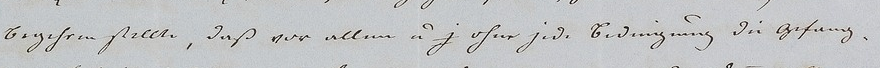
Begehren stellte, daß vor allem u ohne jede Bedingung die Gefang-
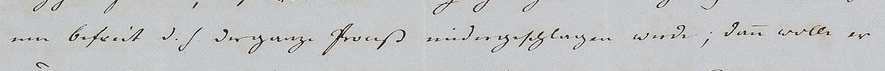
nen befreit d. h. der ganze Proceß niedergeschlagen werde; dann wolle er
